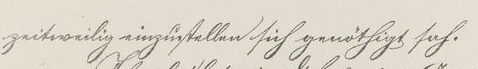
zeitweilig einzustellen sich genöthigt sah.
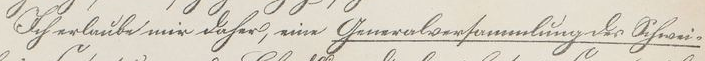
Ich erlaube mir daher, eine Generalversammlung des Schwei-
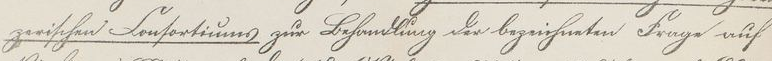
zerischen Consortiums zur Behandlung der bezeichneten Frage auf
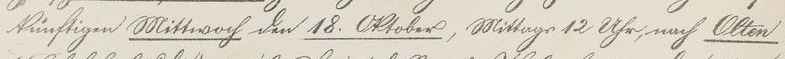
künftigen Mittwoch den 18. Oktober, Mittags 12 Uhr, nach Olten
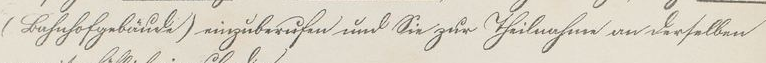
(Bahnhofgebäude) einzuberufen und Sie zur Theilnahme an derselben
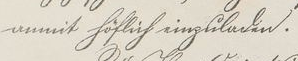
anmit höflich einzuladen.
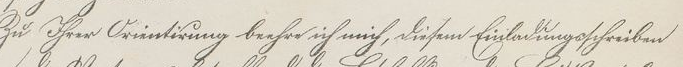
Zu Ihrer Orientirung beehre ich mich, diesem Einladungsschreiben
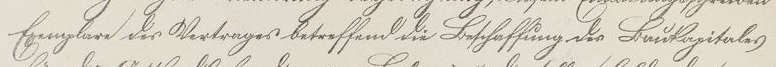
Exemplare des Vertrages betreffend die Beschaffung des Baukapitales
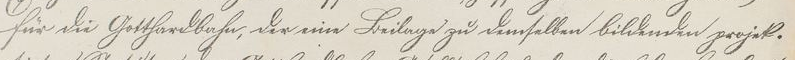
für die Gotthardbahn, der eine Beilage zu demselben bildenden projek-
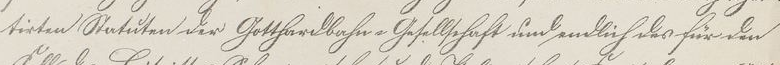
tirten Statuten der Gotthardbahn-Gesellschaft und endlich des für den
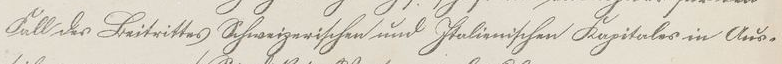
Fall des Beitrittes Schweizerischen und Italienischen Kapitales in Aus-
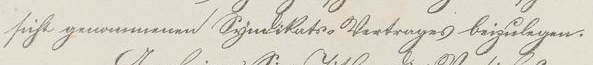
sicht genommenen Syndikats-Vertrages beizulegen.
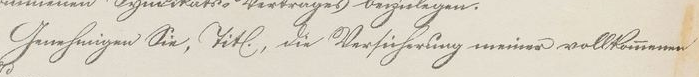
Genehmigen Sie, Tit., die Versicherung meiner vollkommenen
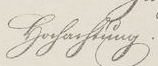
Hochachtung.
